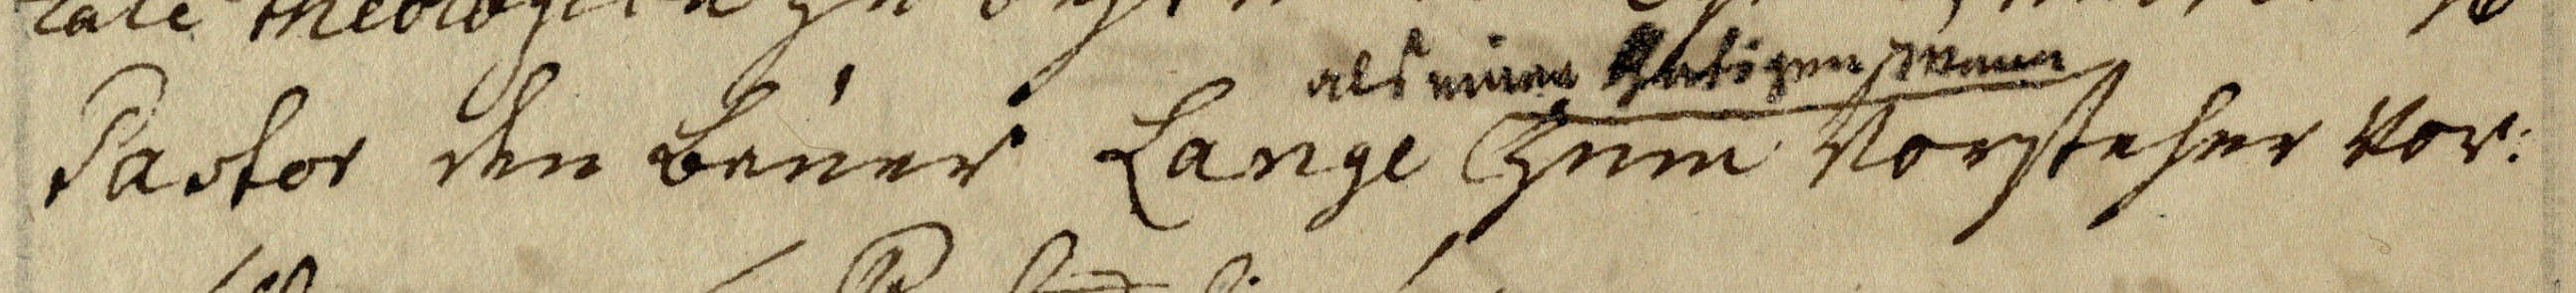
Pastor den Bauer Lange als einen thätigen Mann zum Vorsteher vor¬
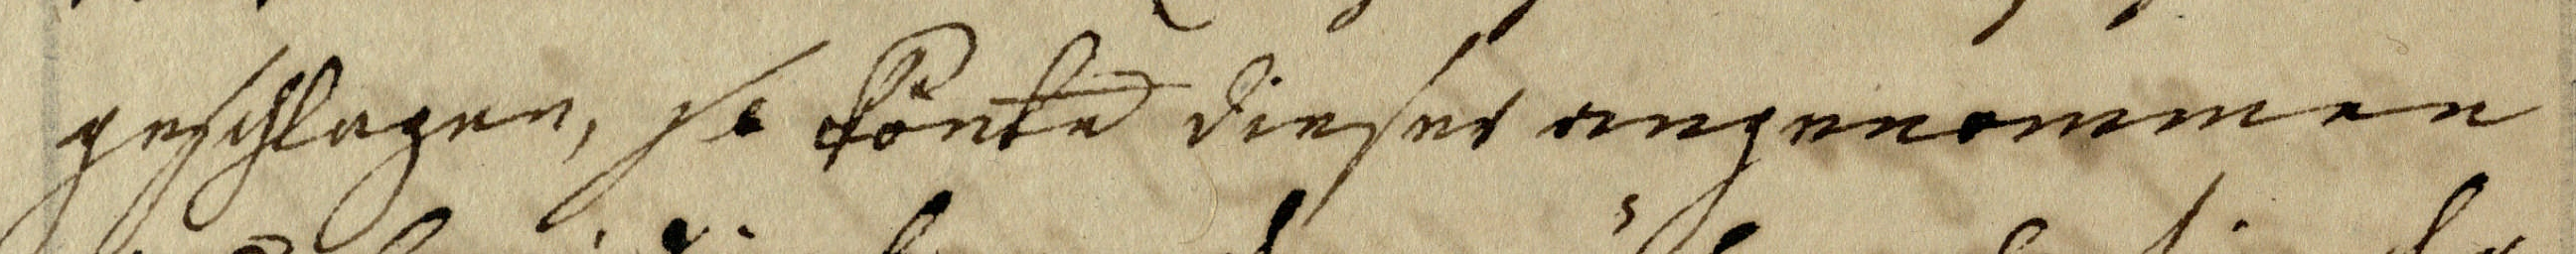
geschlagen, so könte dieser angenommen
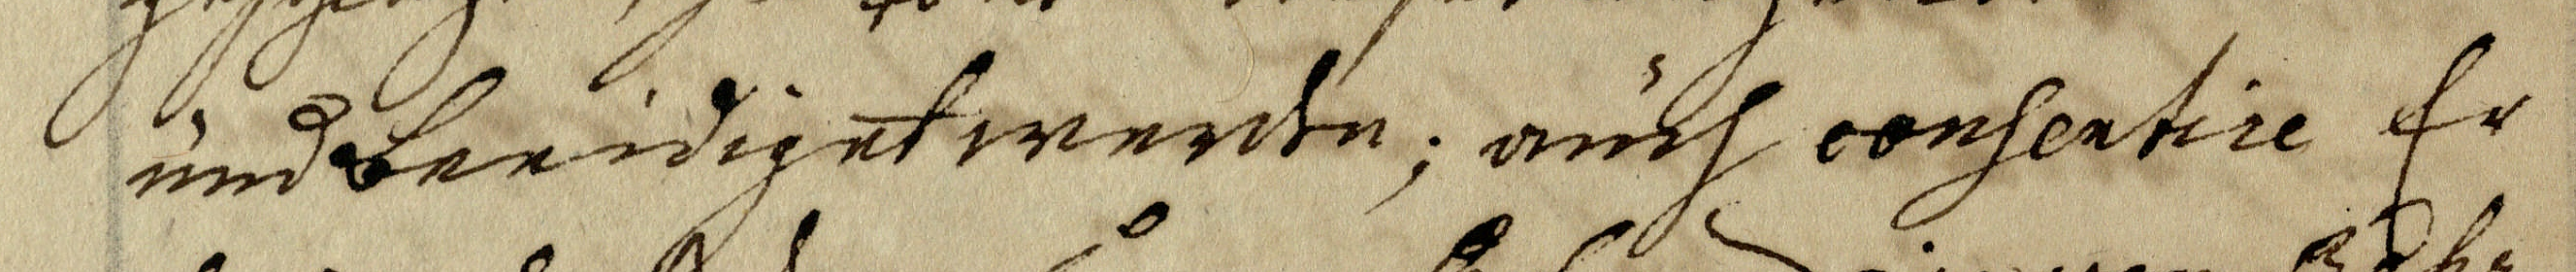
und beeidiget werden, auch consentire Er
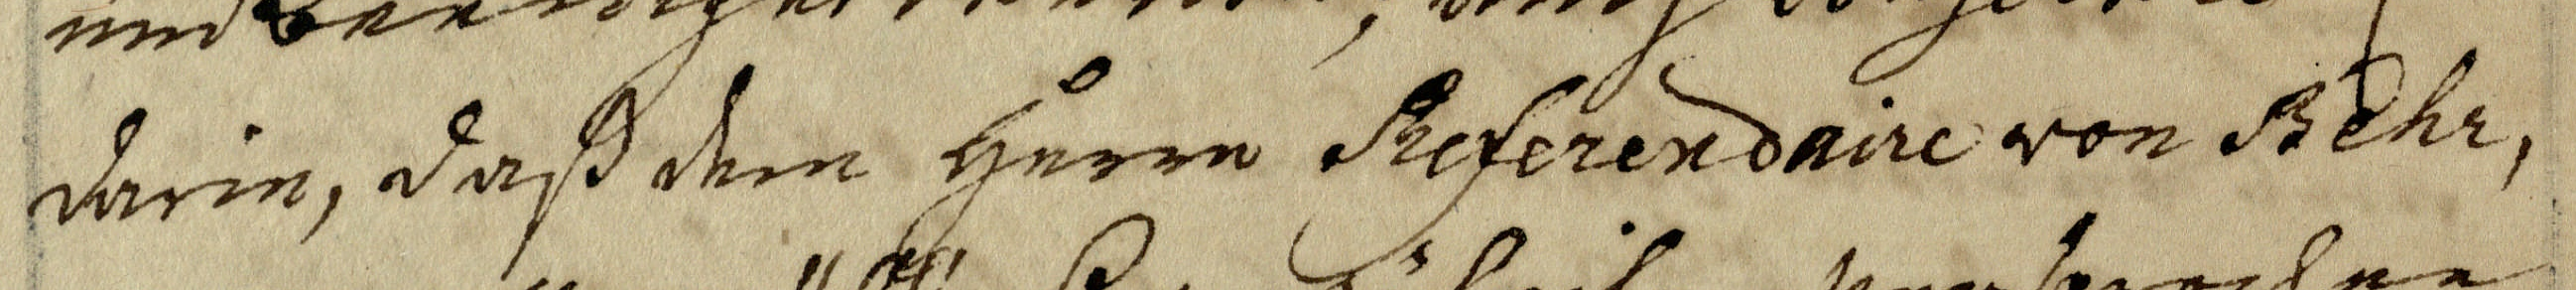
darin, daß dem Herrn Referendaire von Behr,
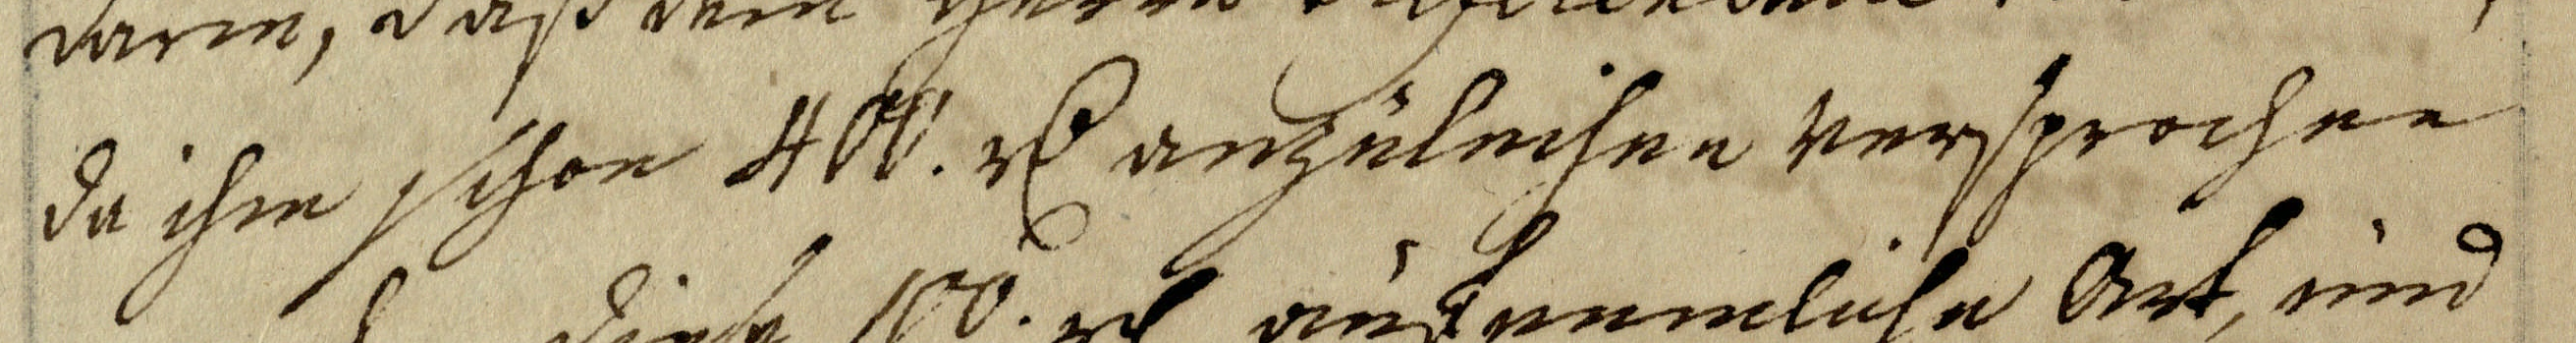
da ihm schon 400. r anzuleihen versprochen
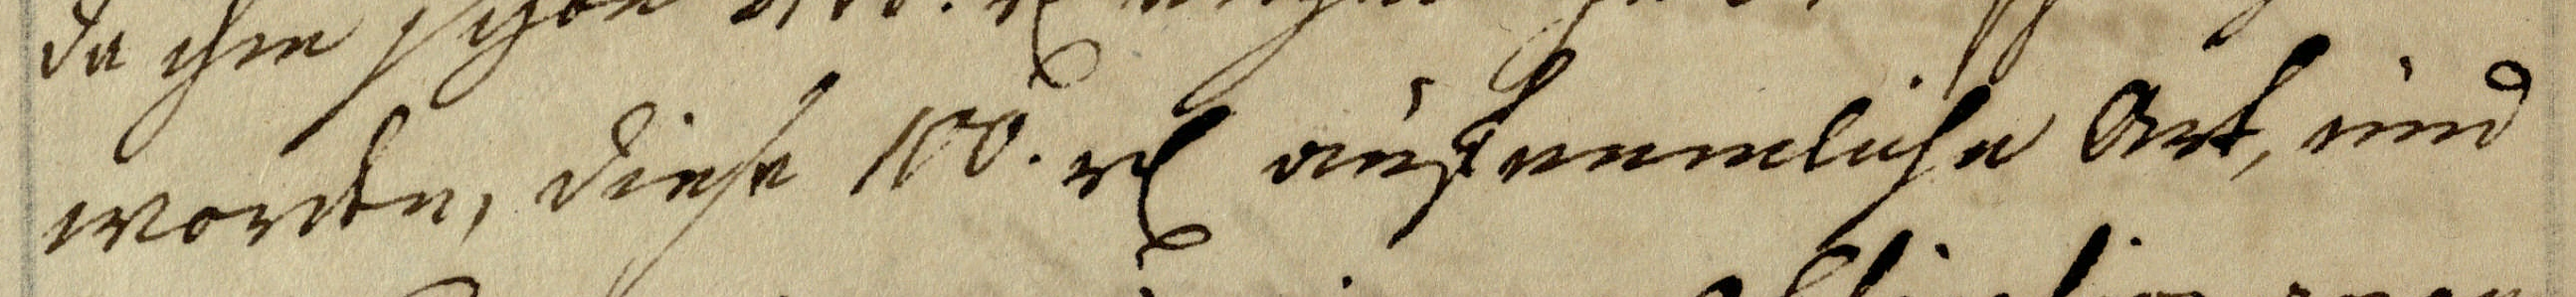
worden, diese 100 rl auf nemliche Art, und
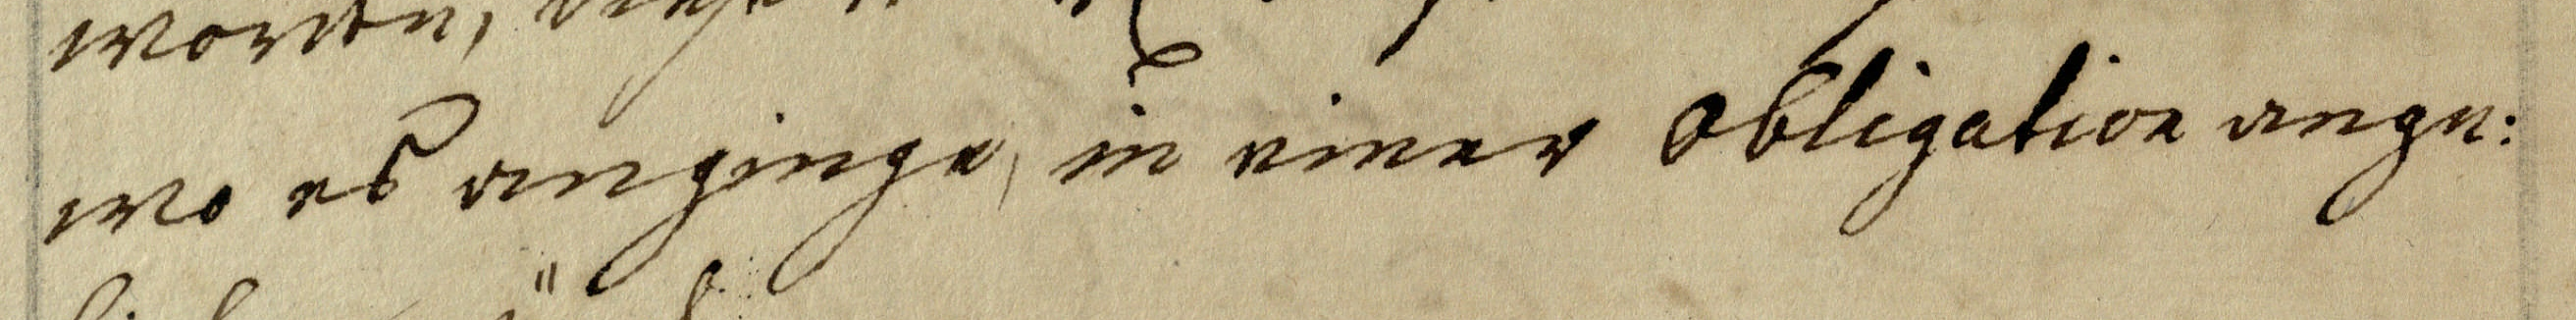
wo es anginge, in einer Obligation ange¬
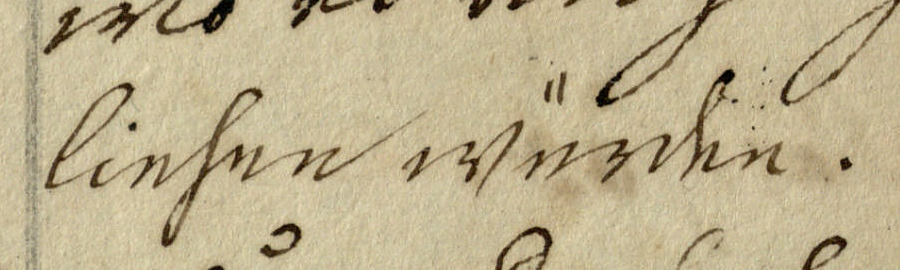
liehen würden.
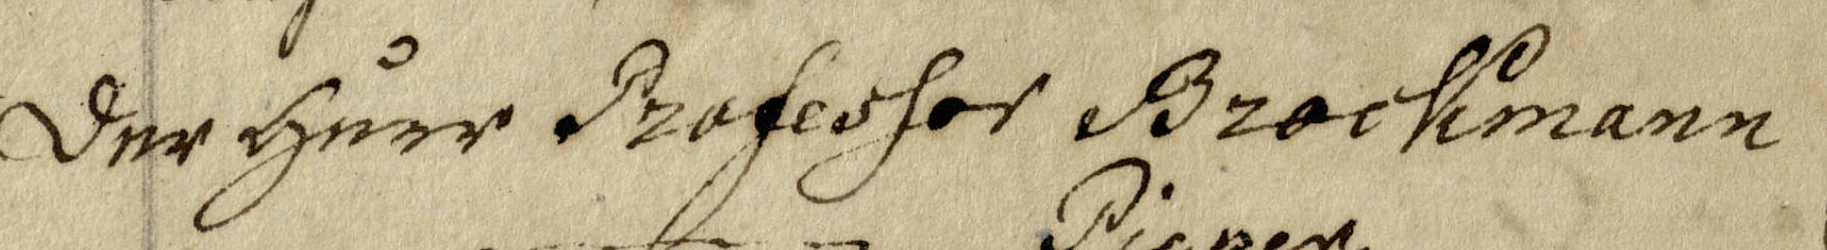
der Herr Professor Brockmann
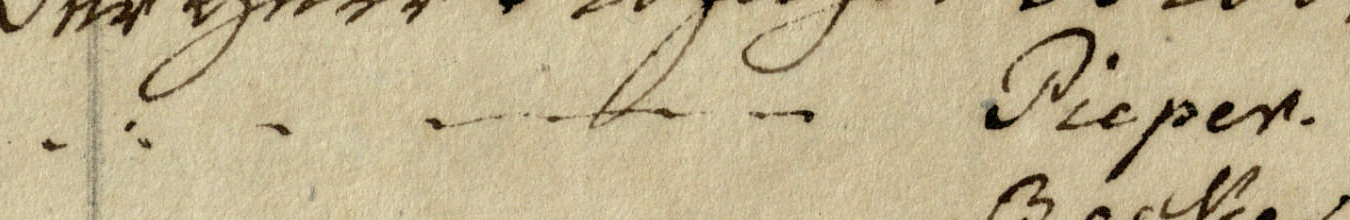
Pieper.
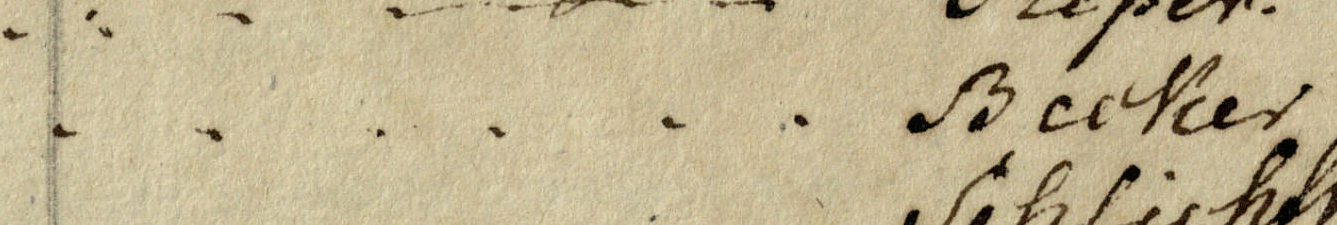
Becker
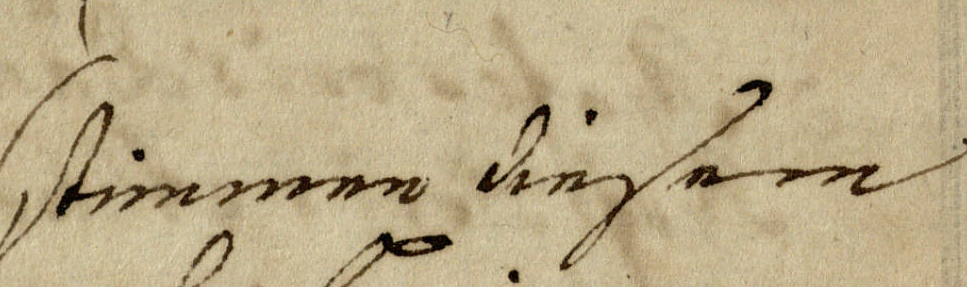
stimmen diesem
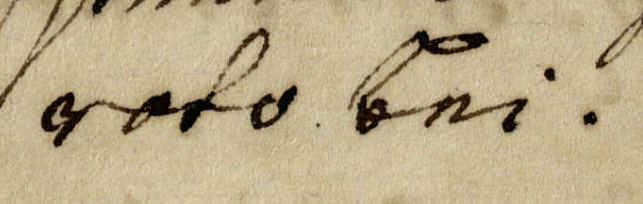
voto bei.
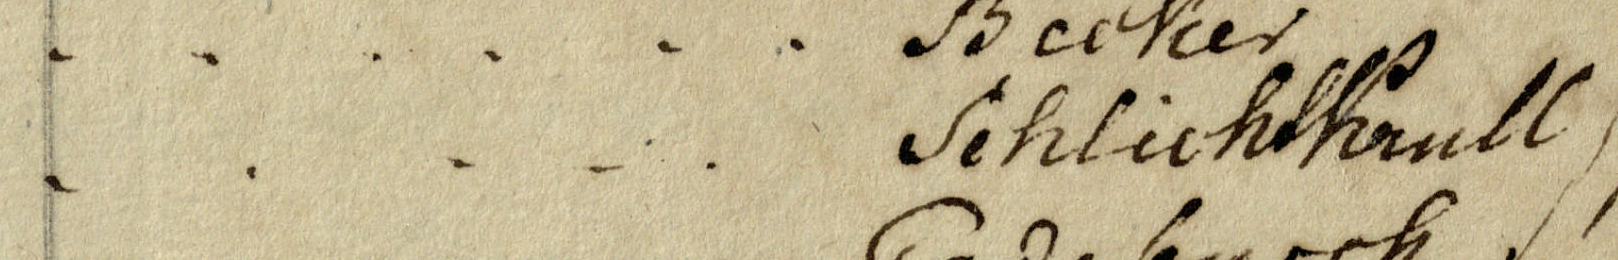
Schlichtkrull
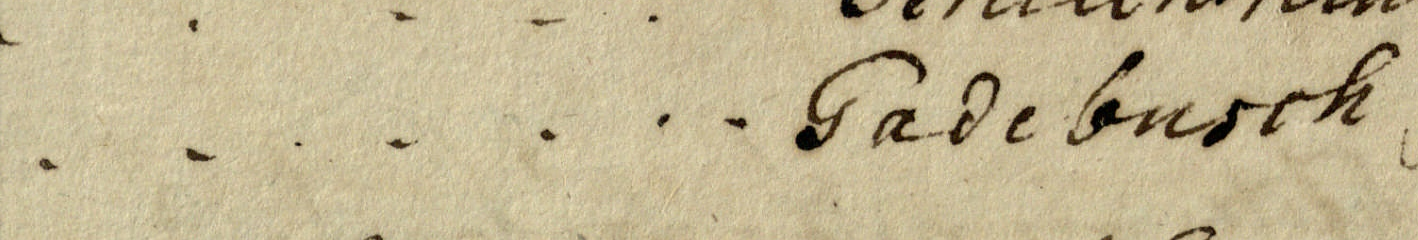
Gadebusch
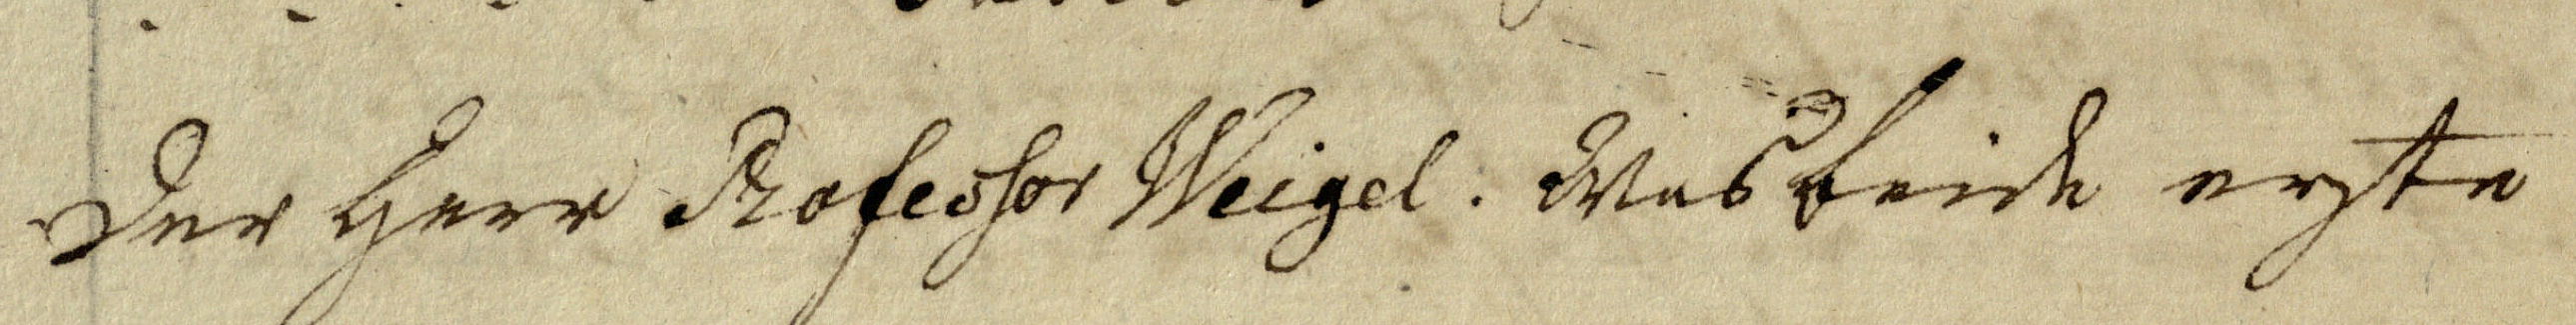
Der Herr Professor Weigel. Was beide erste
